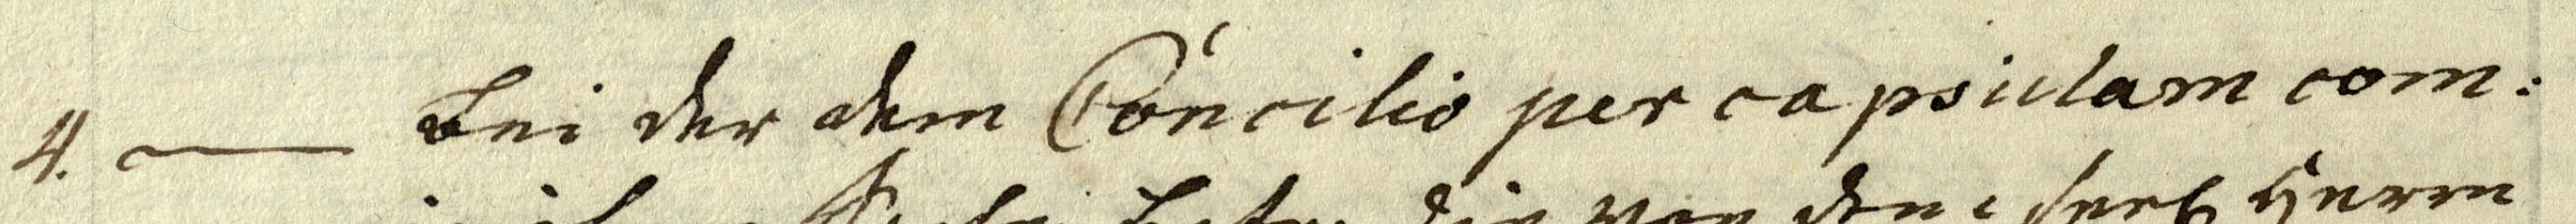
4. Bei der dem Concilio per capsulam com¬
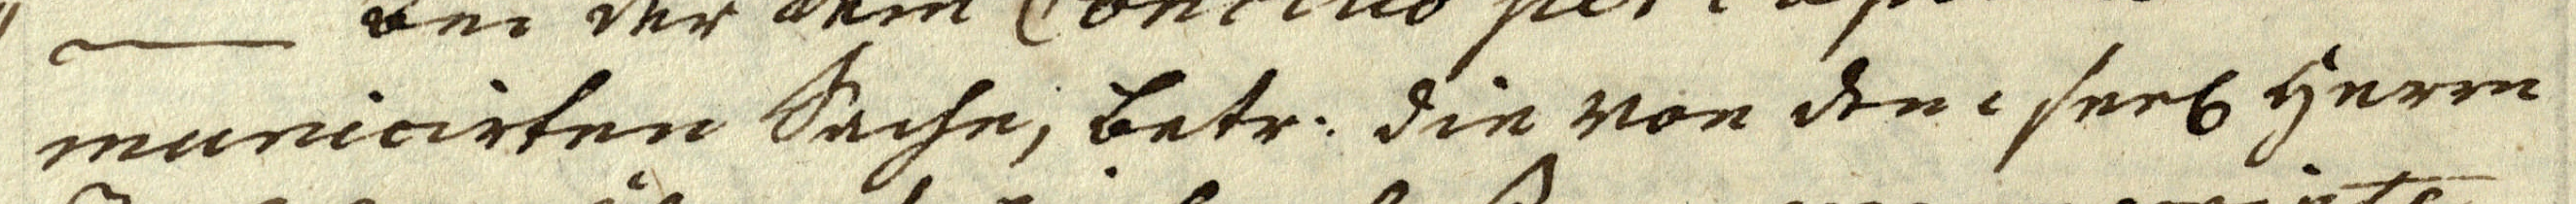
municirten Sache, betr. die von dem seel. Herrn
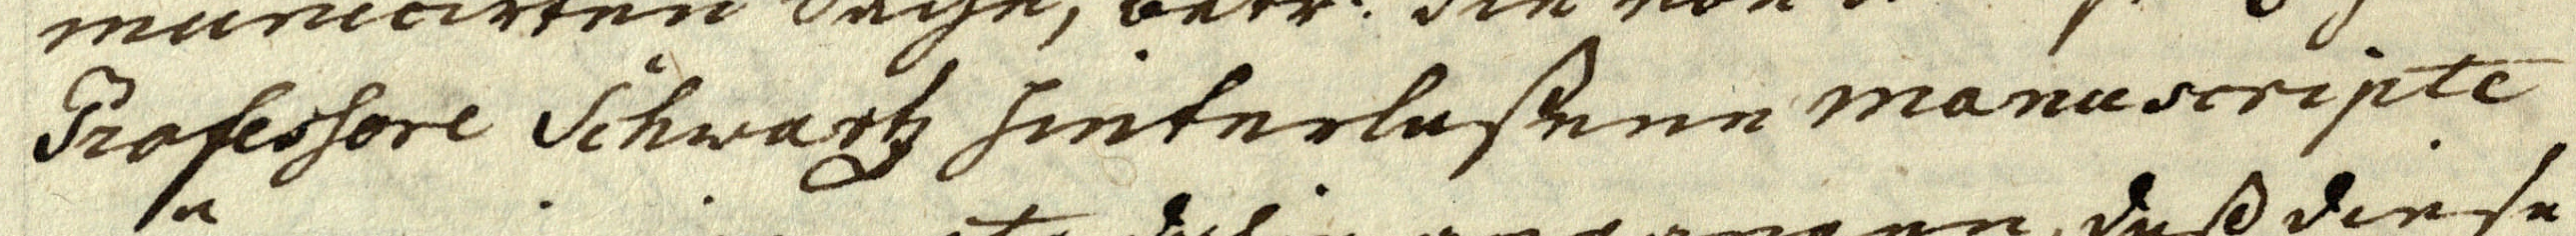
Professore Schwartz hinterlaßene manuscripte
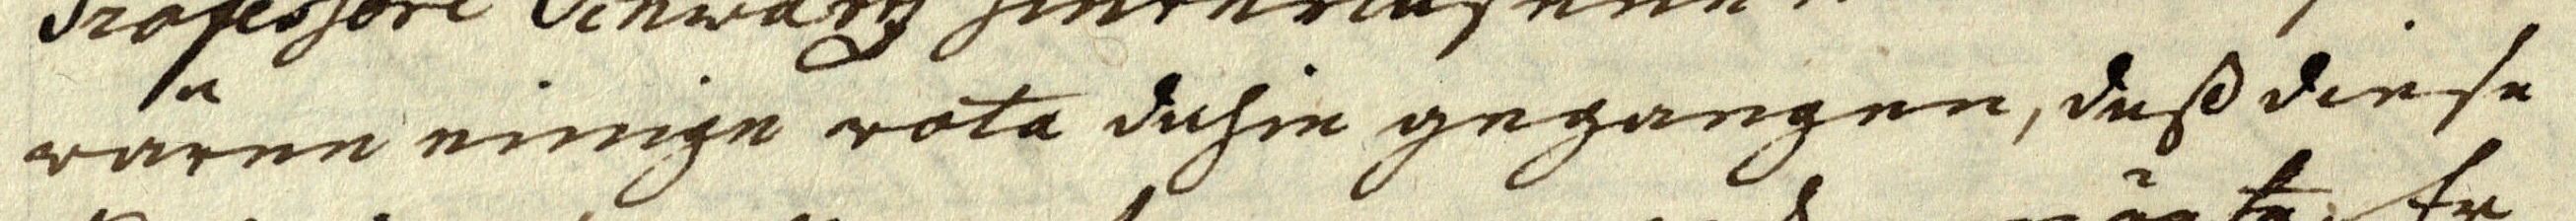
wären einige vota dahin gegangen, daß diese
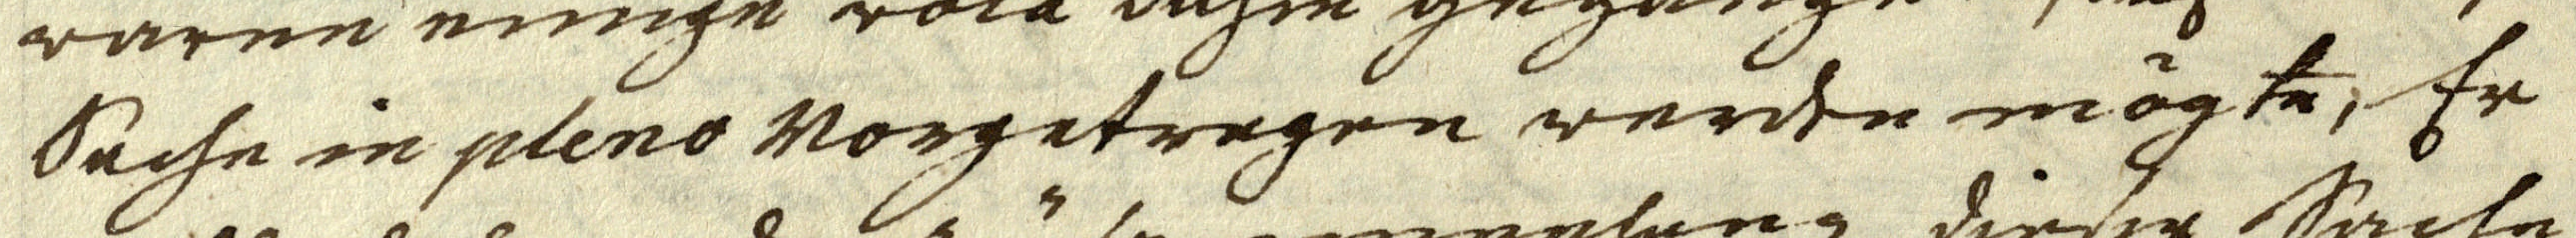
Sache in pleno vorgetragen werden mögte, Er
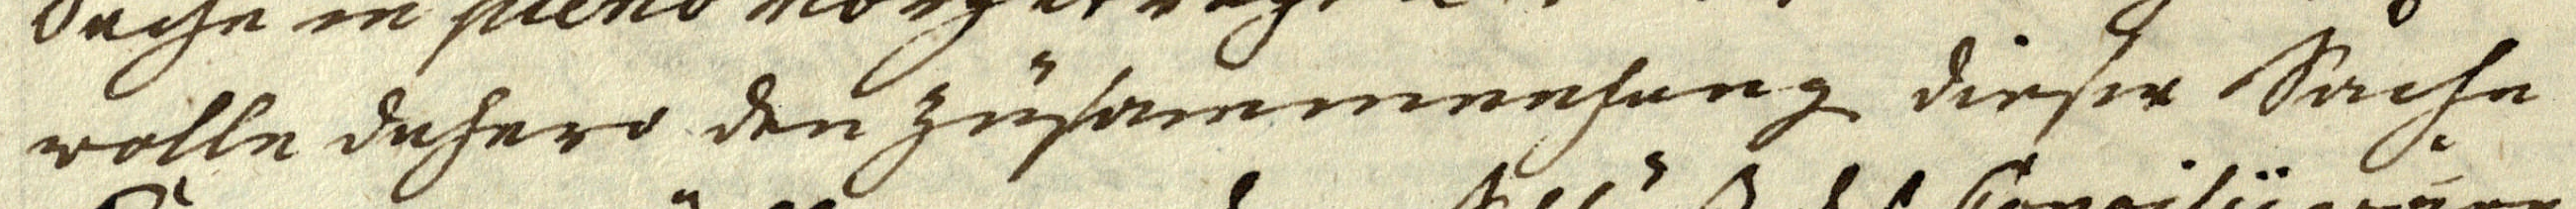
wolle dahero den Zusammenhang dieser Sache
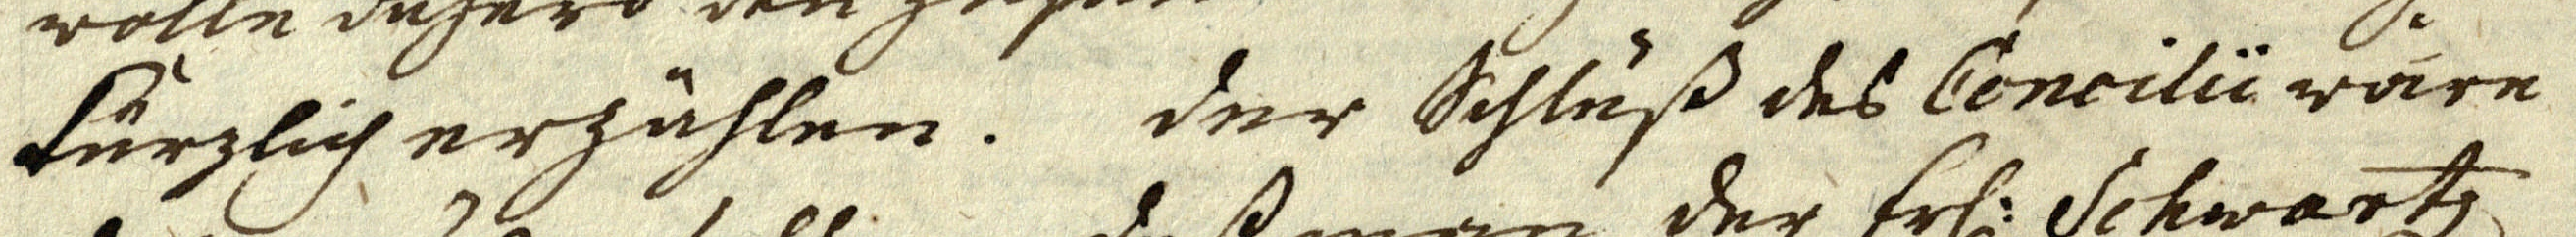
kürzlich erzählen. Der Schluß des Concilii wäre
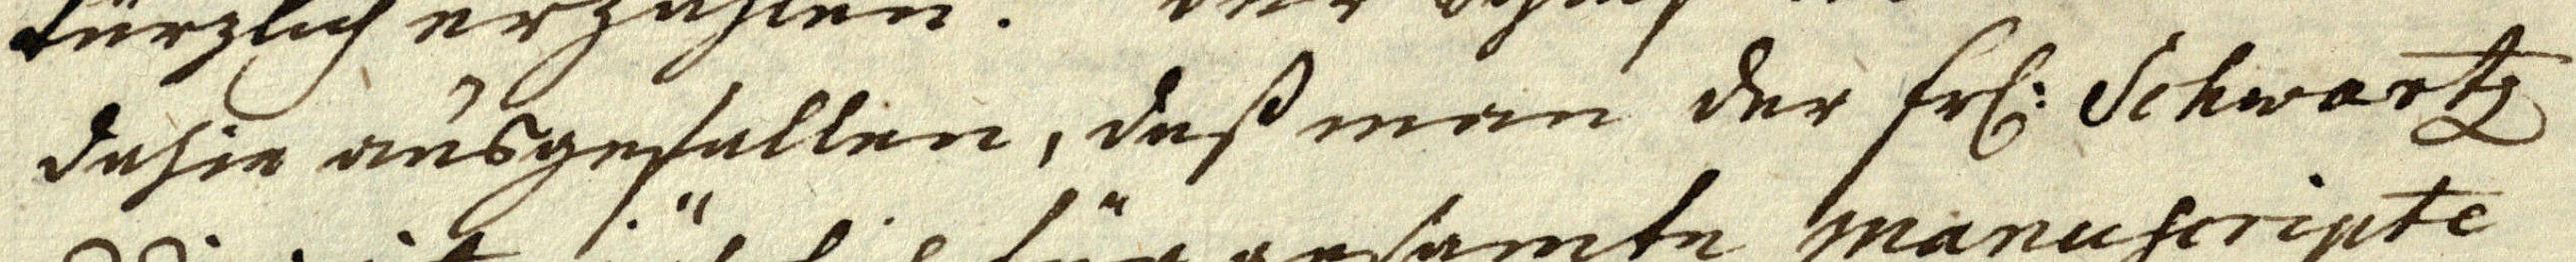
dahin ausgefallen, daß man der Frl. Schwartz
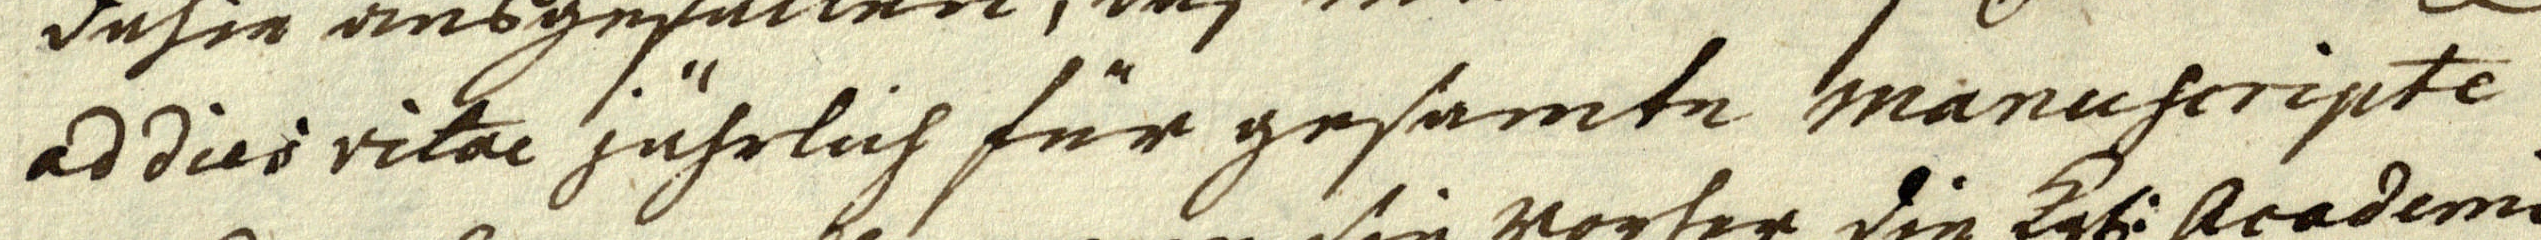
ad dies vitae jährlich für gesamte Manuscripte
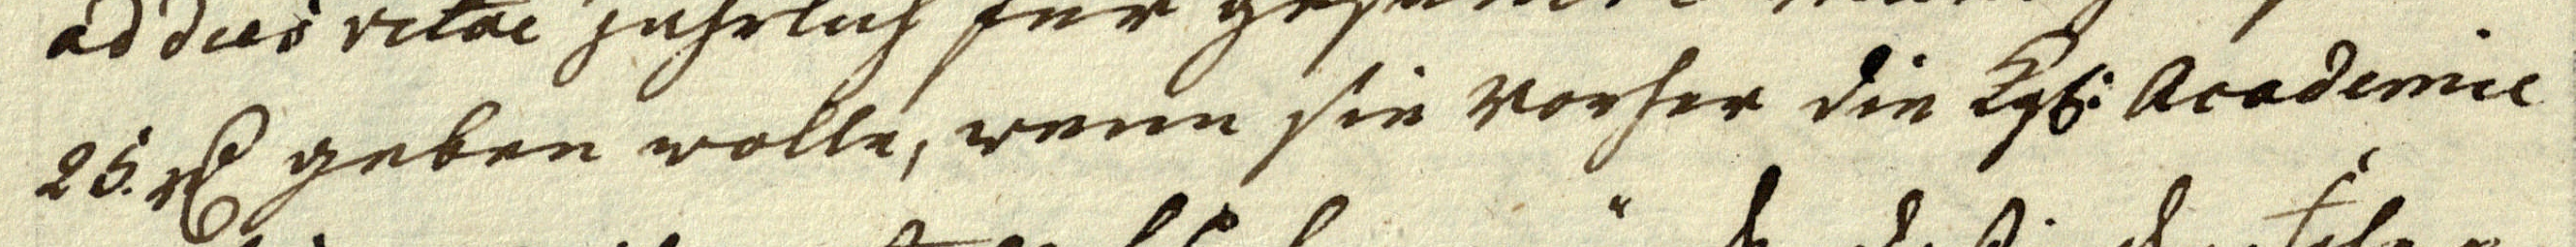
25 rl. geben wolle, wenn sie vorher die Kgl. Academie
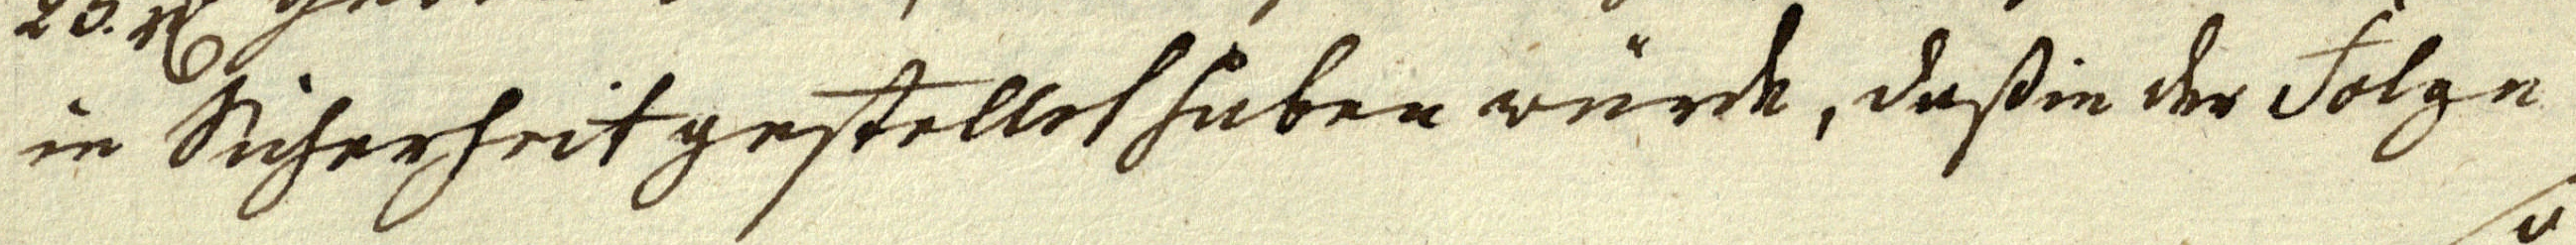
in Sicherheit gestellet haben würde, daß in der Folge
